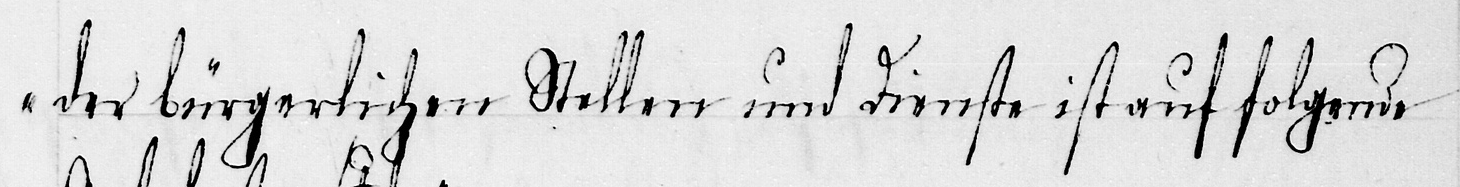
der bürgerlichen Stellen und Dienste ist auf folgende
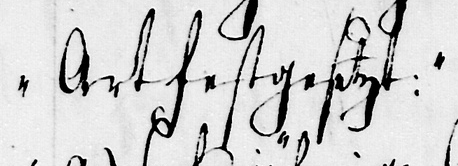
Art festgesetzt:
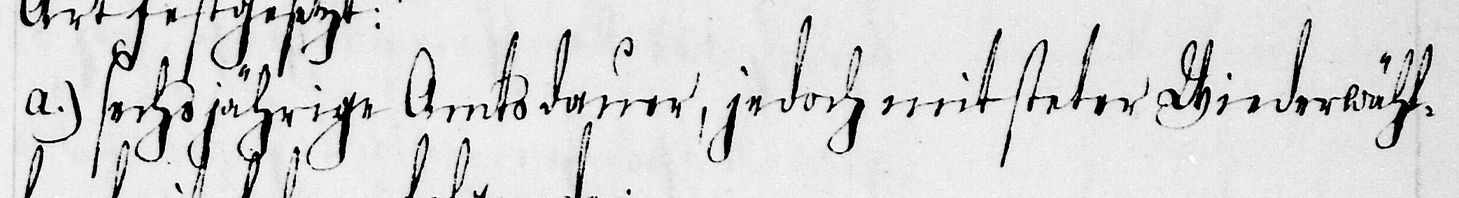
a.) sechsjährige Amtsdauer, jedoch mit steter Wiederwähl¬
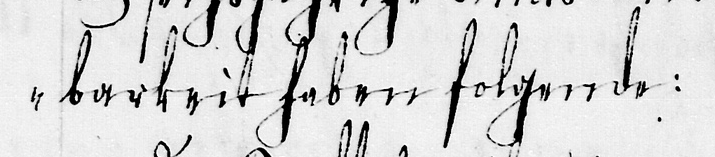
barkeit haben folgende:
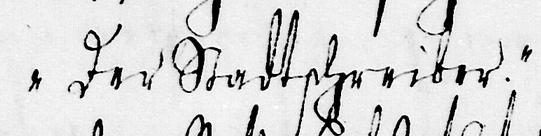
Der Stadtschreiber.
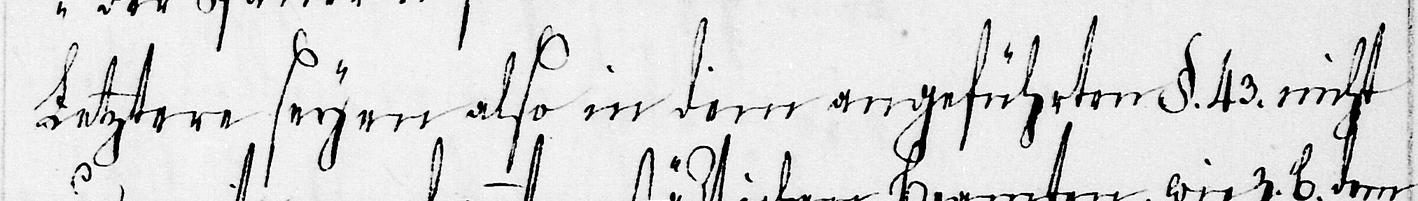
Letztere seyen also in dem angeführten §. 43. nicht
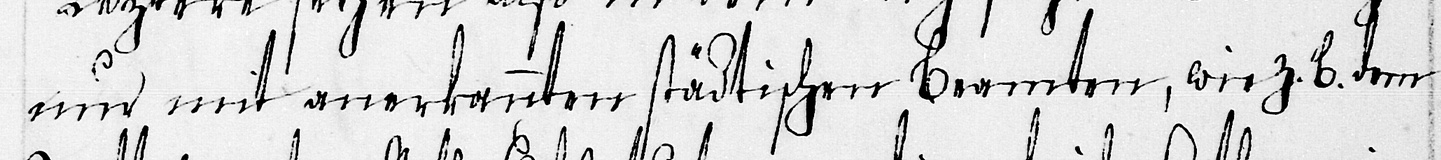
nur mit anerkannten städtischen Beamten, wie z.B. dem
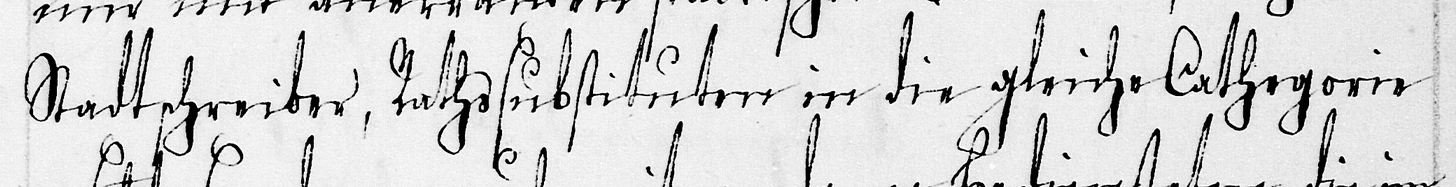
Stadtschreiber, Rathssubstituten in die gleiche Cathegorie
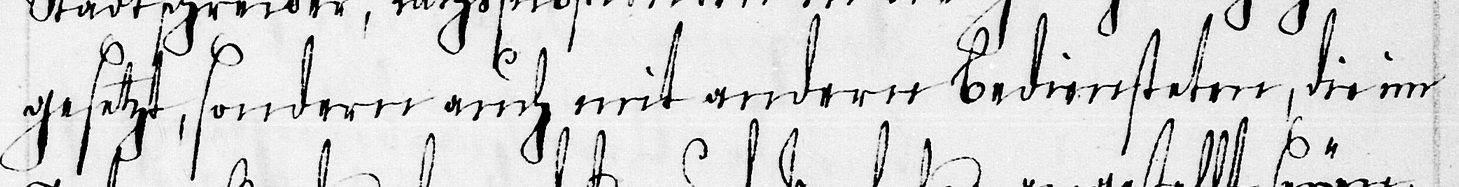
gesetzt, sondern auch mit andern Bediensteten, die im
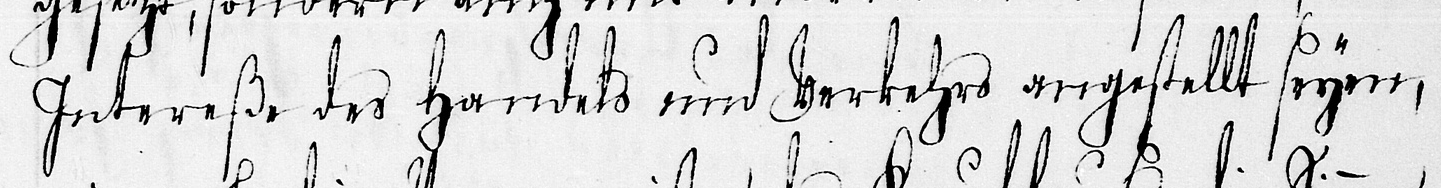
Intereße des Handels und Verkehrs angestellt seyen,
